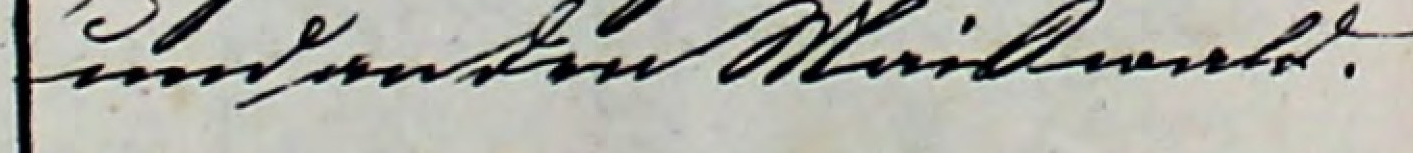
und an den Maiswald.
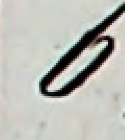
6
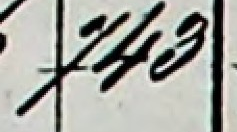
743
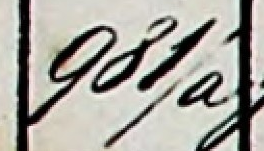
981/a
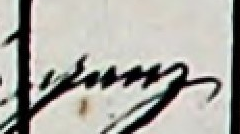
ganz
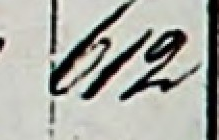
612
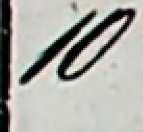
10
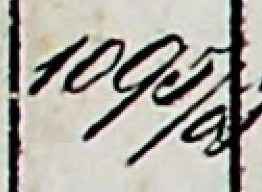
1095/a
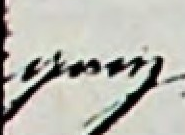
ganz
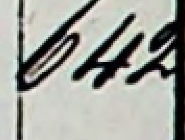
642
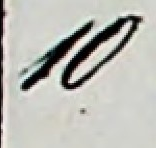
10
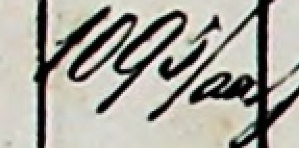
1095/aa
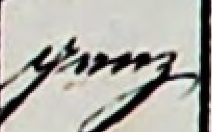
ganz
